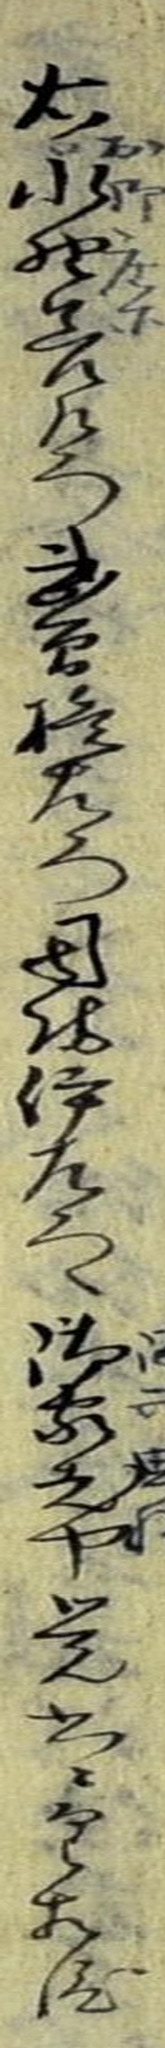右◦於御座所水野善左衛門武曾権左衛門周防伊左衛門へ御家老中覚書ニ而被相渡
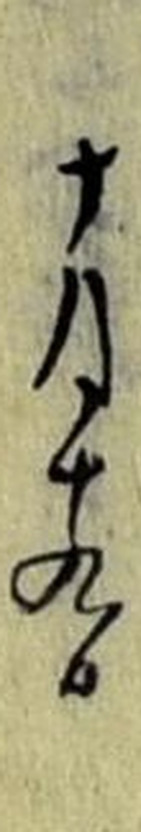十月十九日
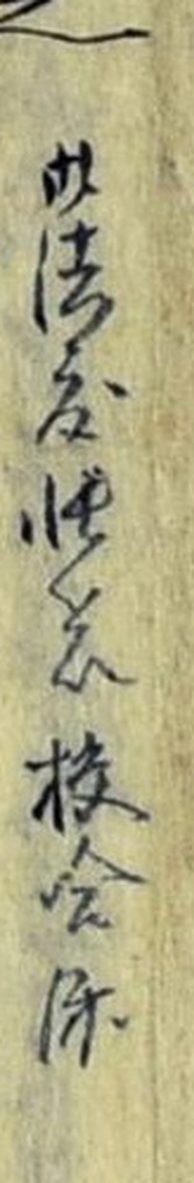定御法度帳を以校合済
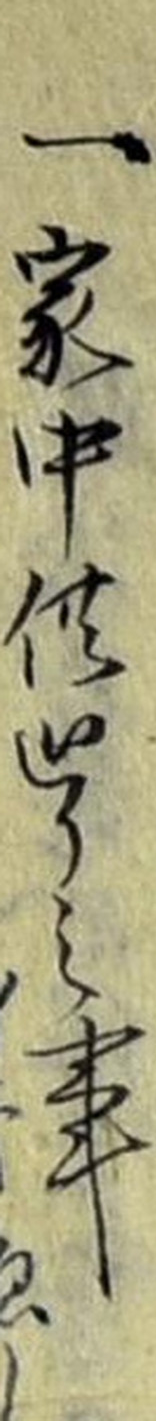一家中供廻り之事

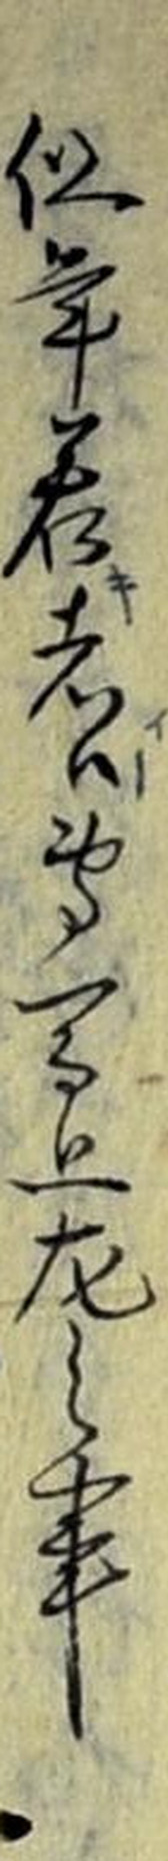但年若キ者ハ専馬上尤之事
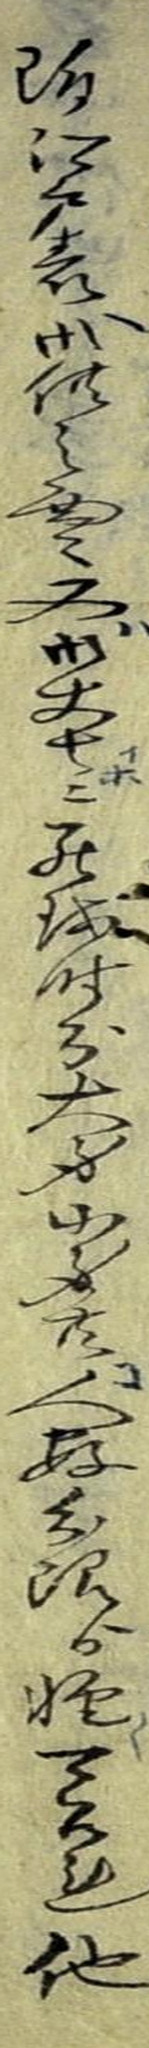附江戸表へ御供之面々又ハ御使者ニ罷越時分大身小身共に人数分限ゟ軽く可召連他
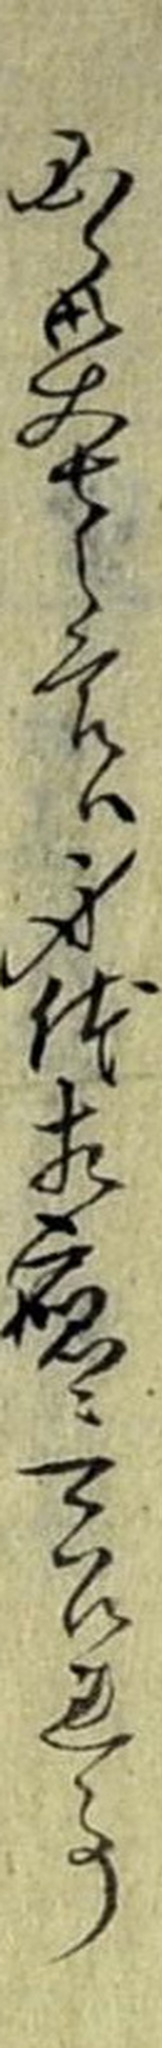国之御使者之節ハ身体相応ニ可召連事
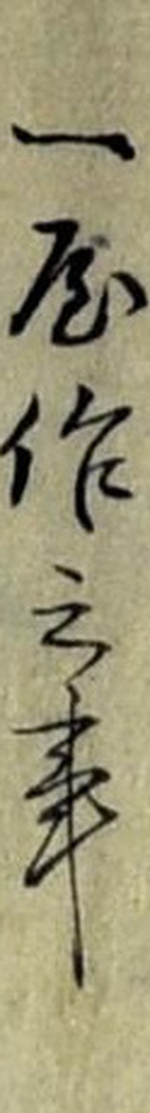一屋作之事
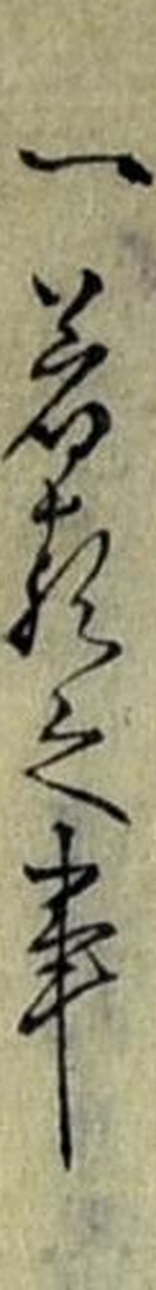一着類之事
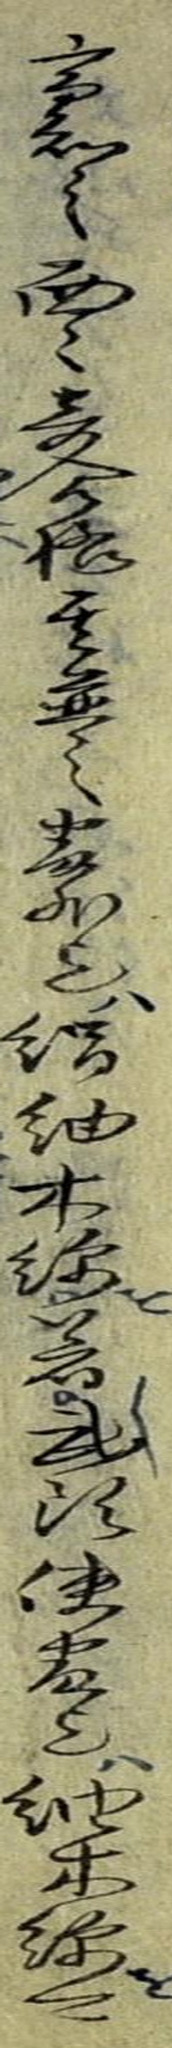高知之面々寄合格其並之番外迄ハ絹紬木綿◦を着◦し武頭使番迄ハ紬木綿を可
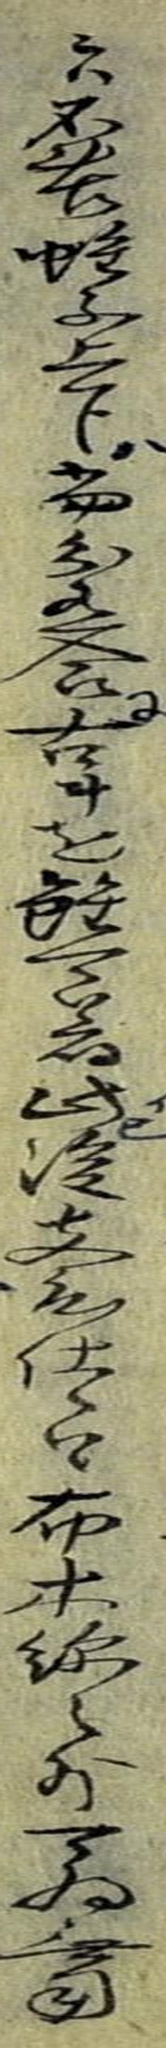ニハ不苦帷子上下ハ当分有合に古キを雖可着此後支度仕候ハヽ布木綿之外可為無用
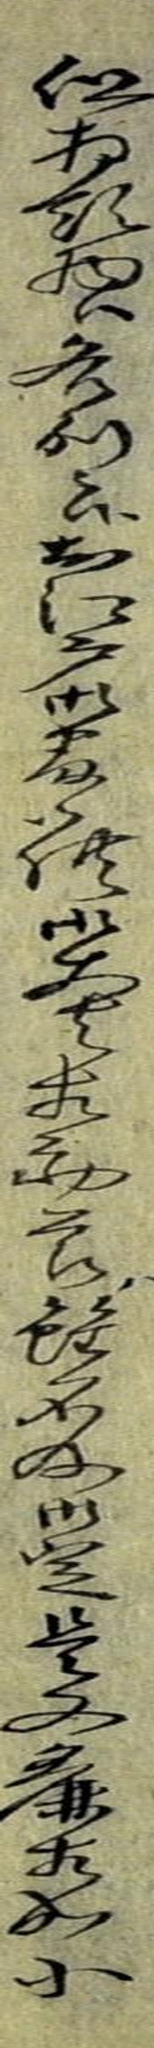但拝領物ハ各別ニ候於江戸御番御供御使者相勤節ハ雖不及御定是又麁相成小
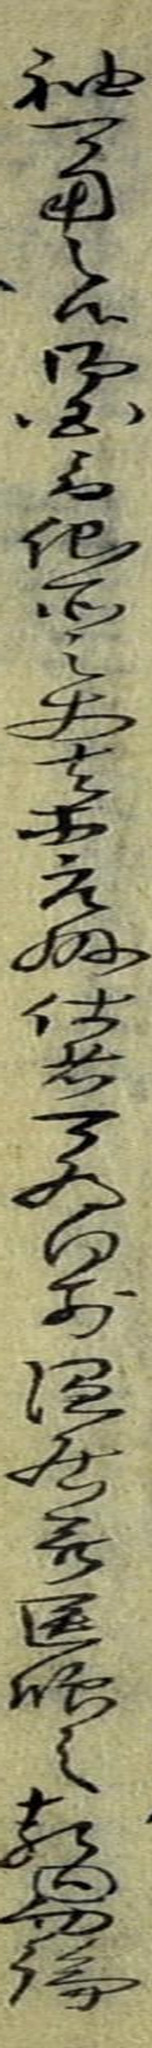袖可用之候御国ニ而他所之使者等取扱仕者可為同前隠居并医師之類ハ勿論
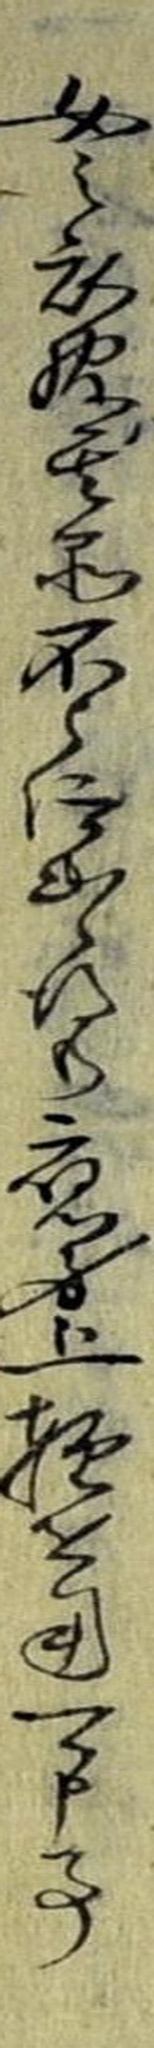女之衣服ハ其品不被仰出候得共応身上軽を用可申事
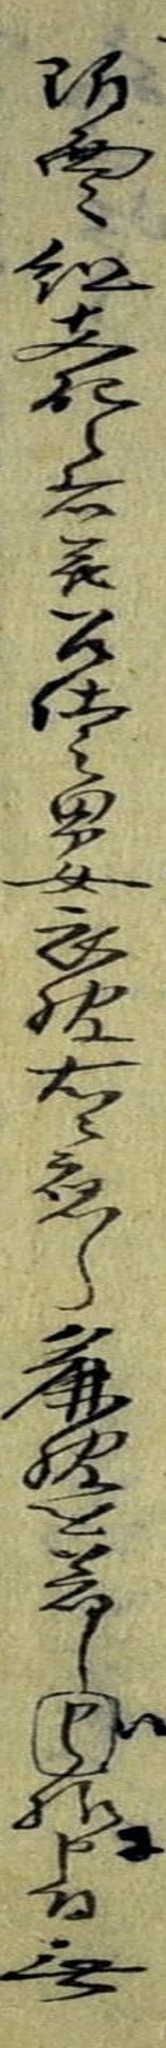附面々組支配之者并召仕之男女衣服右ニ応し麁服を着し申候候様に申付無
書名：命令之部 一
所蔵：福井県文書館 Fukui Prefectural Archives
